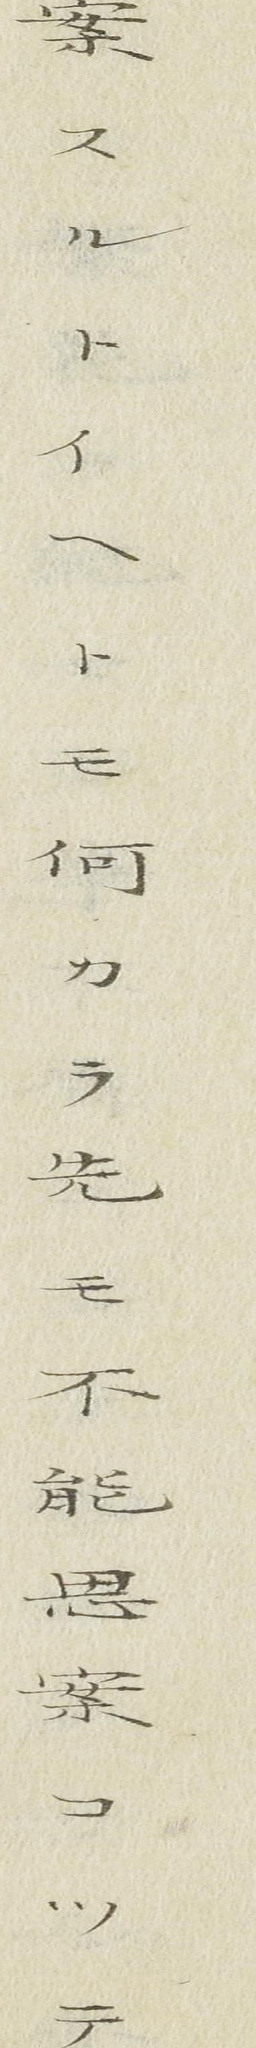案スルトイヘトモ何カラ先モ不能思案コツテ
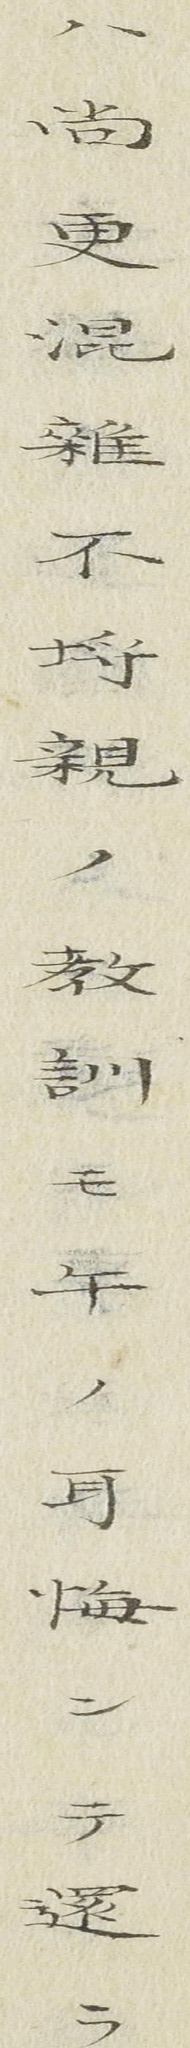ハ尚更混雑不埒親ノ教訓モ午ノ耳悔ンテ還ラ
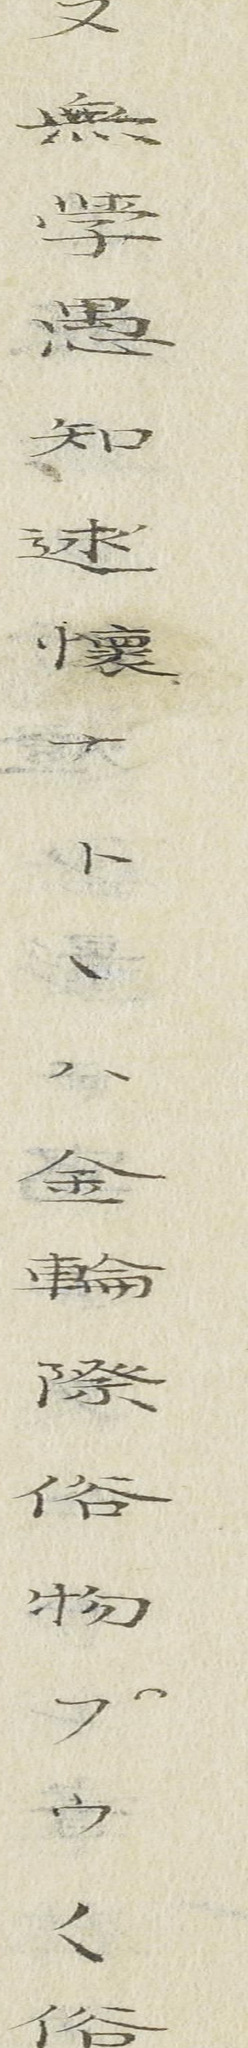ヌ無学愚知述懐ナトヽハ金輪際俗物プウく俗
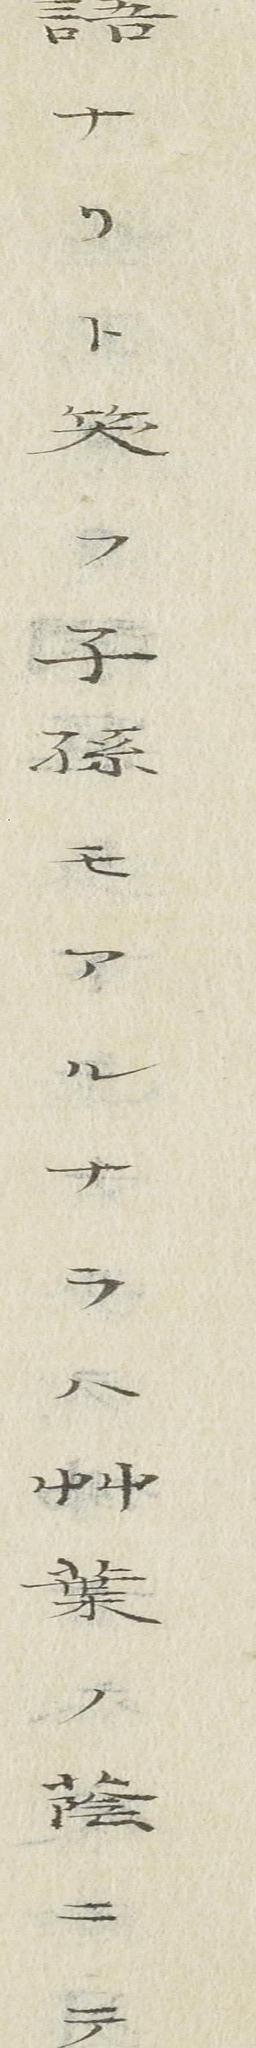語ナリト笑フ子孫モアルナラハ草葉ノ蔭ニテ
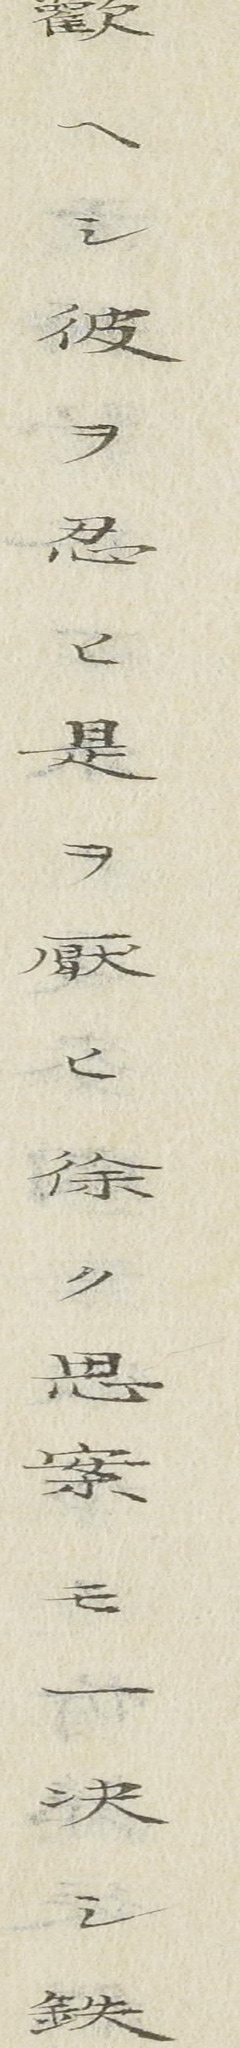歎ヘシ彼ヲ忍ヒ是ヲ厭ヒ徐ク思案モ一決シ鉄
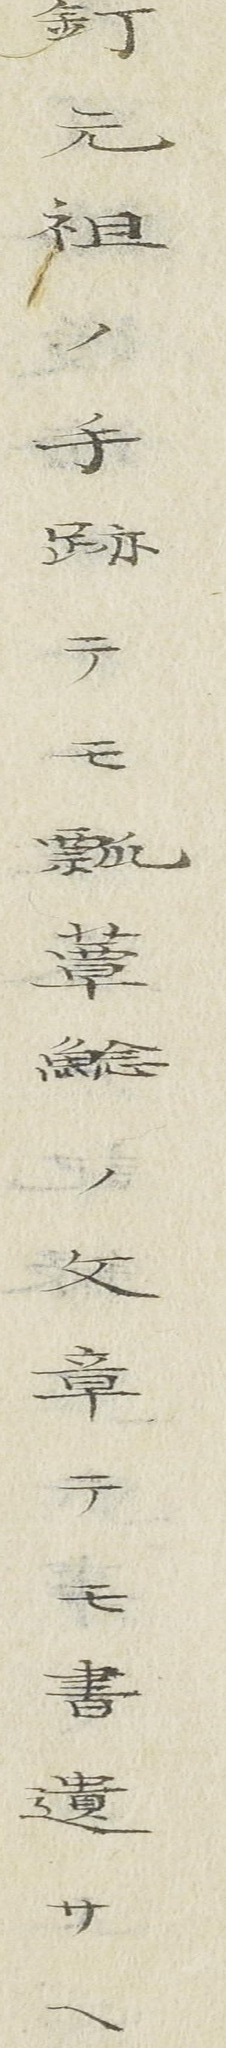釘元祖ノ手跡テモ瓢箪鯰ノ文章テモ書遺サヘ
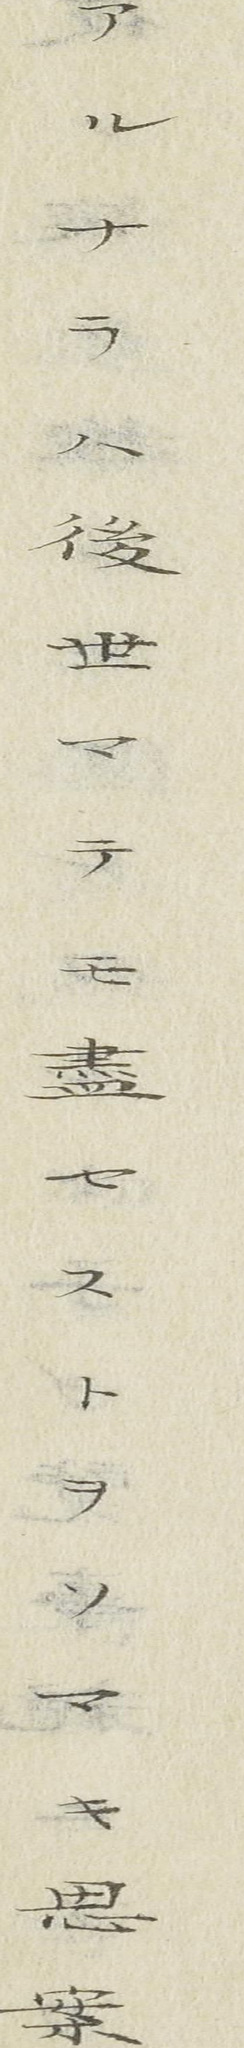アルナラハ後世マテモ尽セストヲソマキ思案
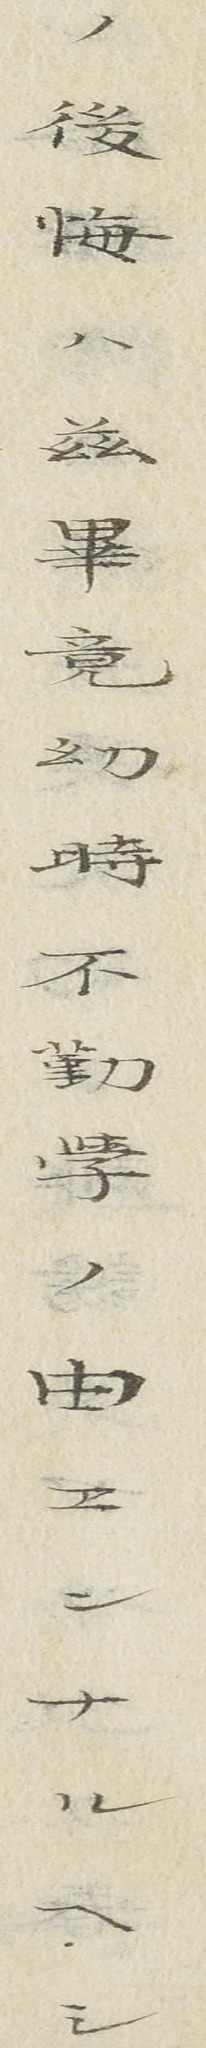ノ後悔ハ茲畢竟幼時不勤学ノ由エシナルヘシ
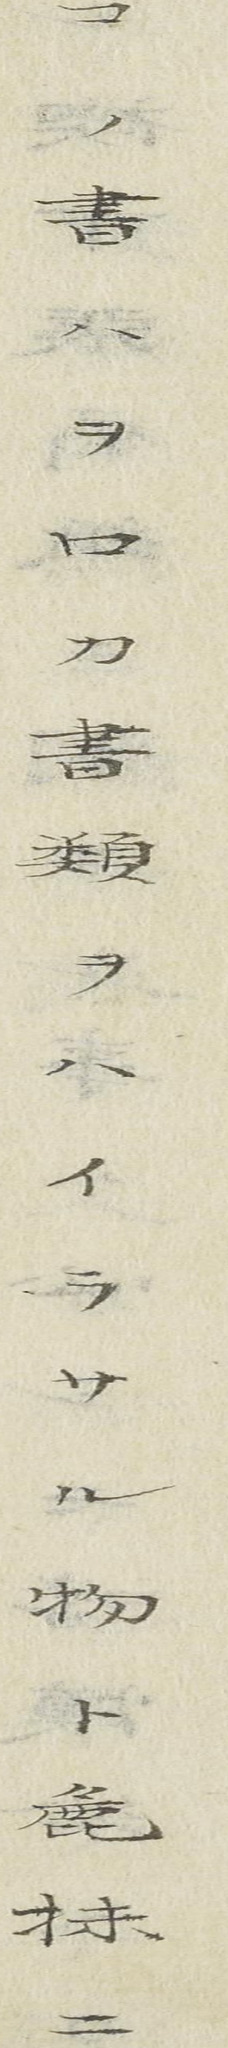コノ書ハヲロカ書類ヲハイラサル物ト麁抹ニ

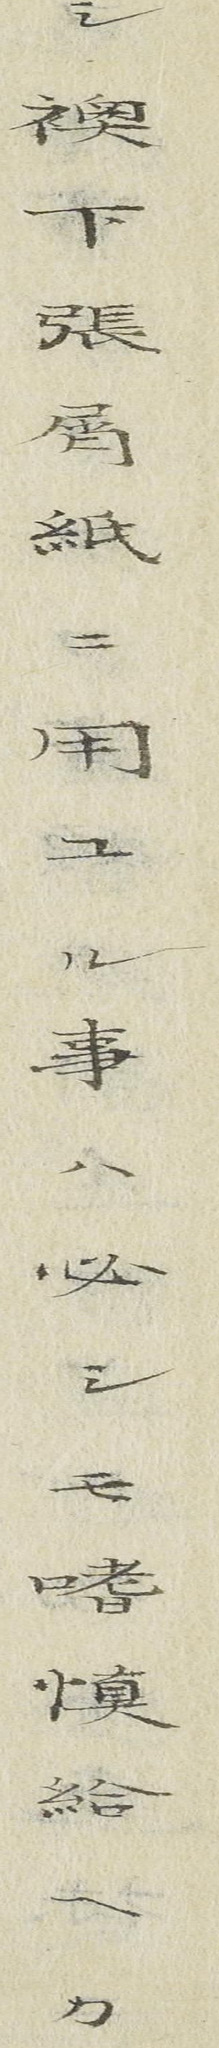シ襖下張屑紙ニ用ユル事ハ必シモ嗜慎給ヘカ
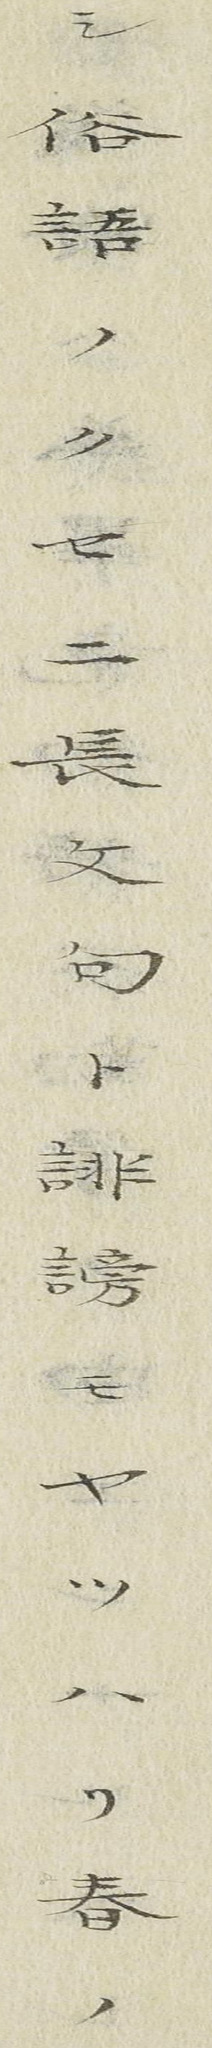シ俗語ノクセニ長文句ト誹謗モヤツハリ春ノ
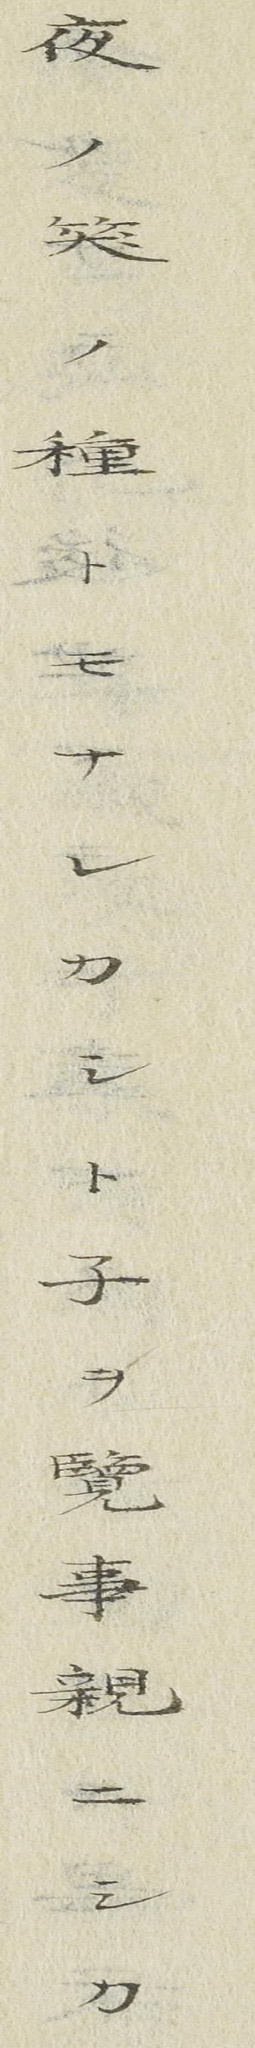夜ノ笑ノ種トモナレカシト子ヲ覧事親ニシカ
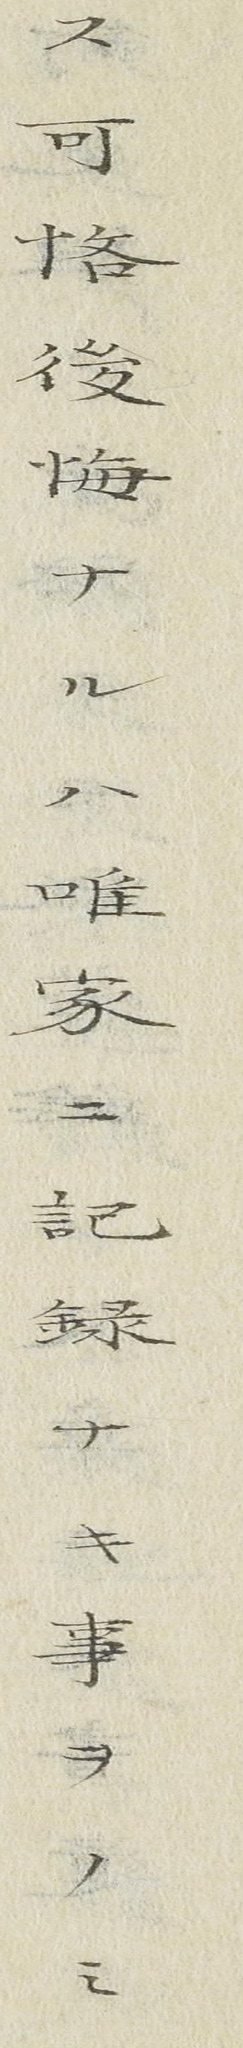ス可悋後悔ナルハ唯家ニ記録ナキ事ヲノミ
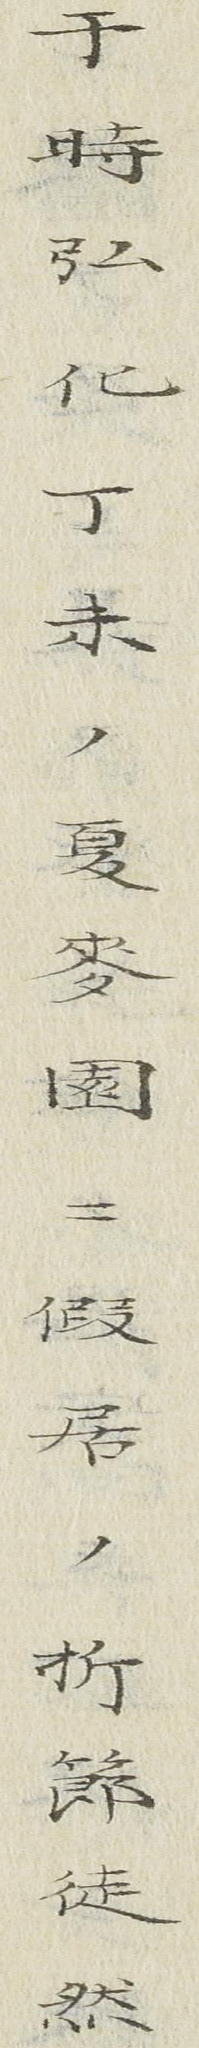干時弘化丁末ノ夏麦園ニ仮居ノ折節徒然
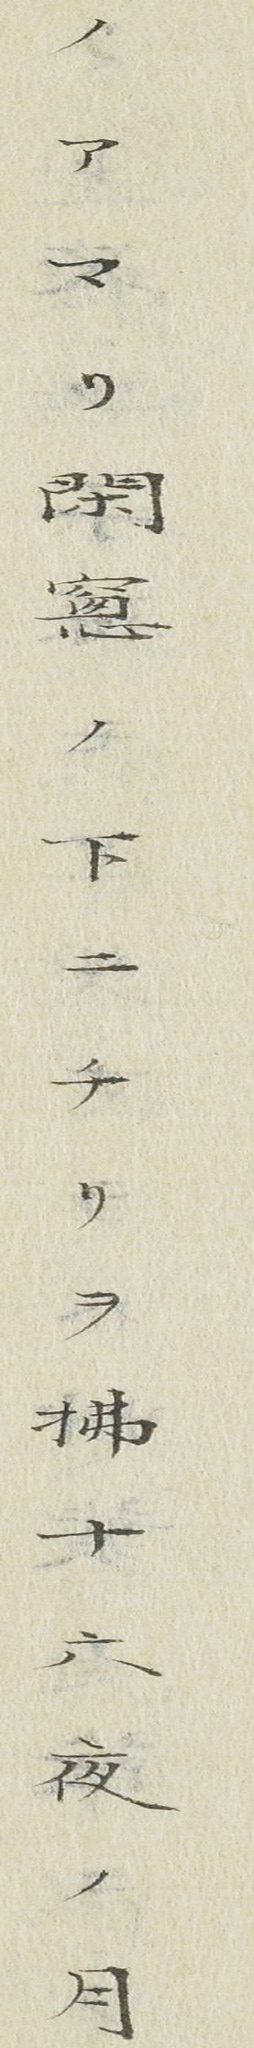ノアマリ閑窓ノ下ニチリヲ払十六夜ノ月
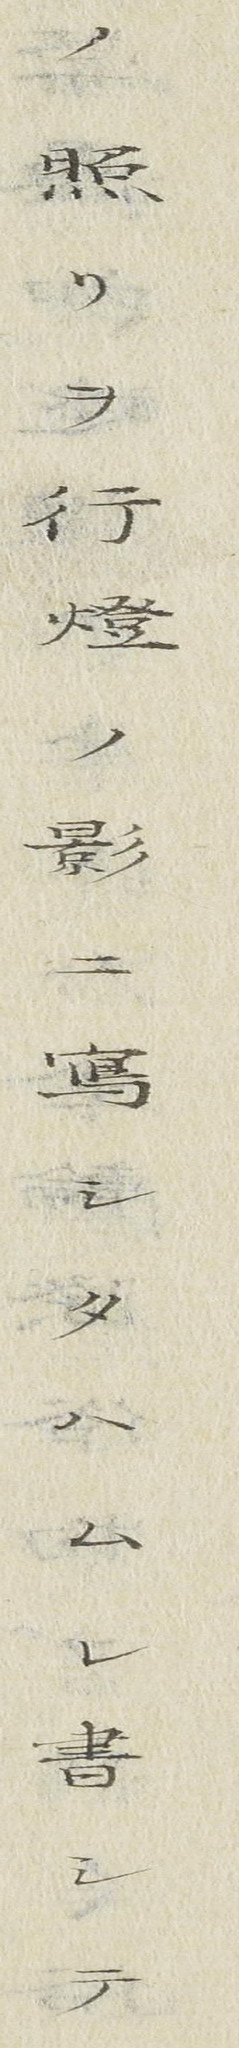ノ照リヲ行燈ノ影ニ写シタハムレ書シテ
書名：地災撮要　地震之部　巻ノ二
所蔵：東京大学地震研究所図書室 Earthquake Research Institute Library, The University of Tokyo, JAPAN
